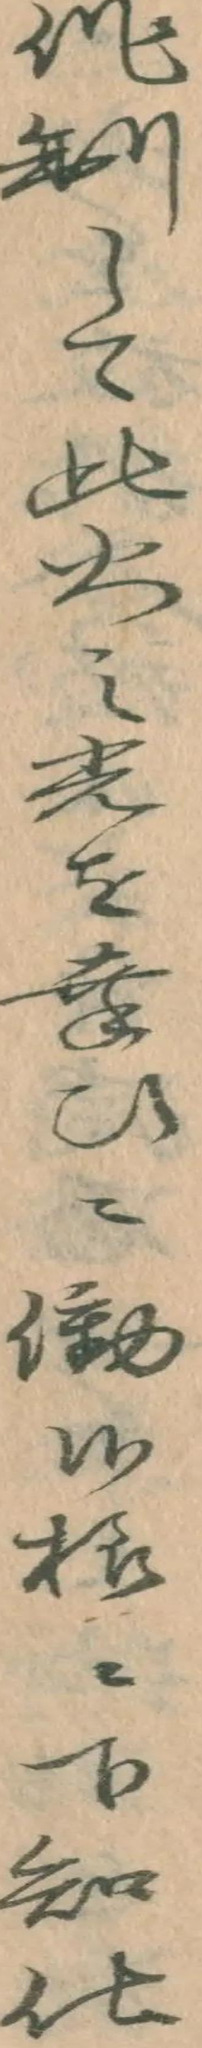作制して此火之光を幸ひに働候様に下知仕
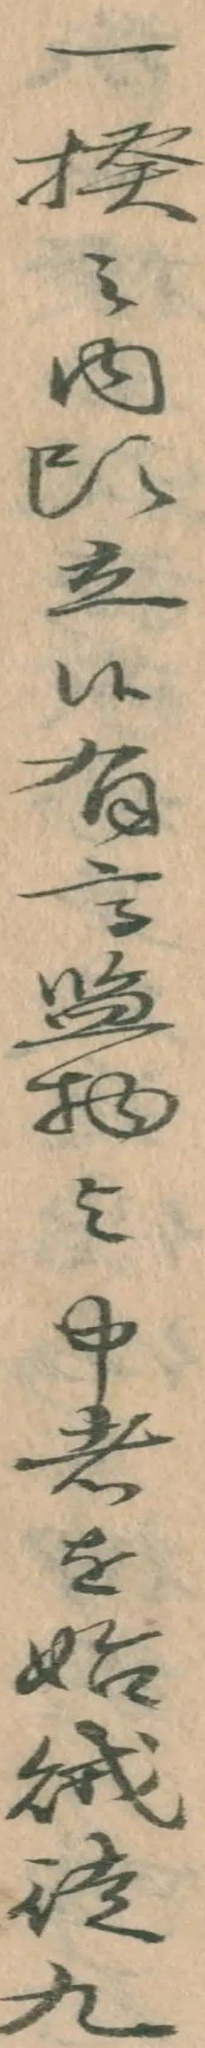一揆之内頭立候有高監物与申者を始賊徒九
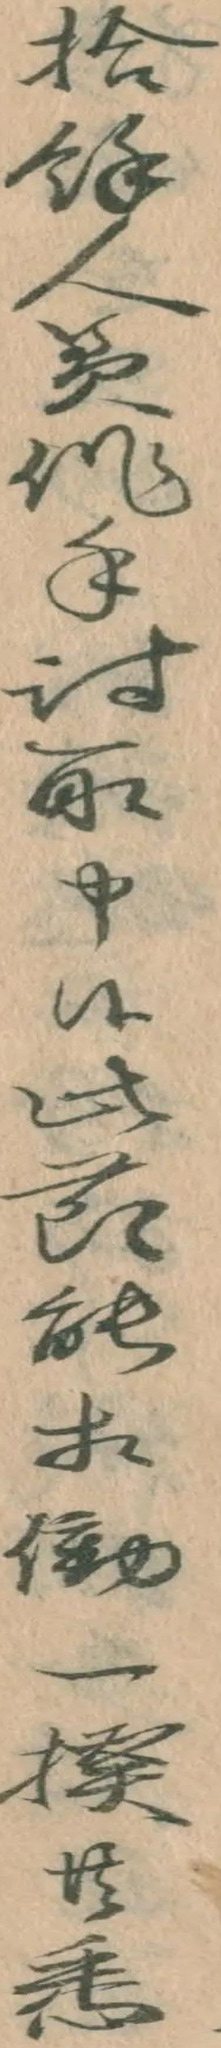拾余人美作手討取申候此節能相働一揆共悉
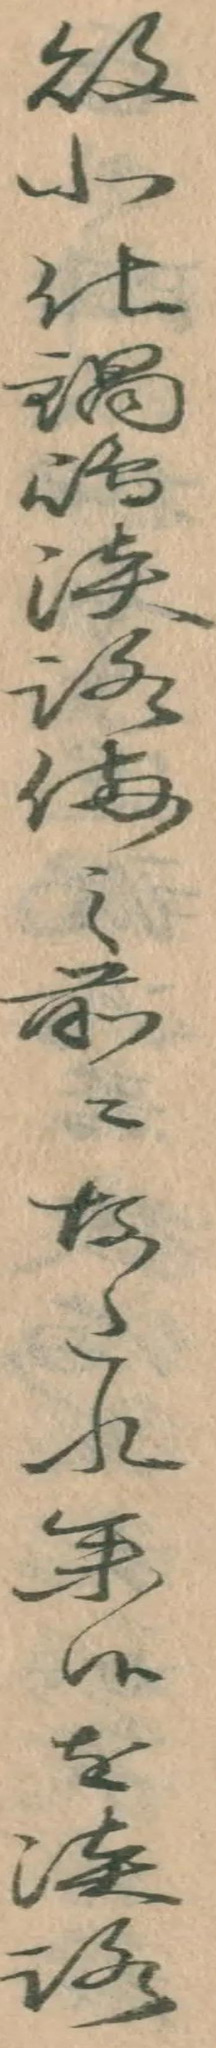敗北仕鍋島淡路備之前になたれ参候を淡路
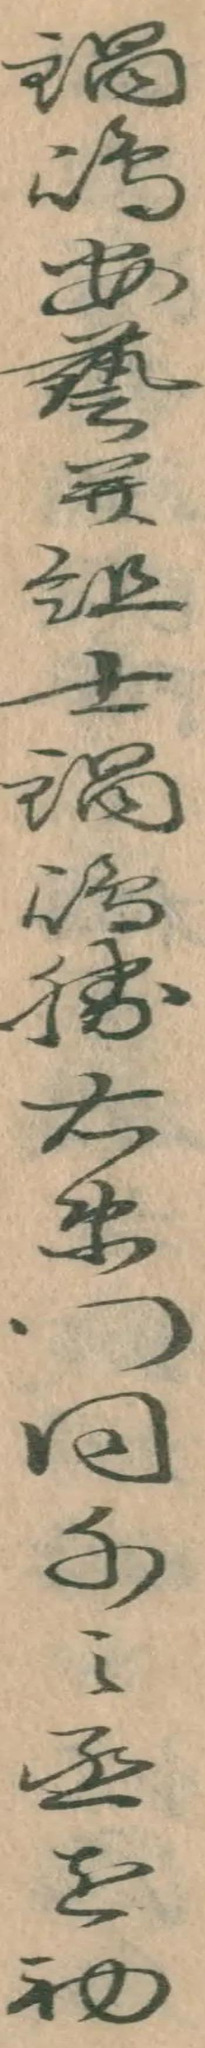鍋島安芸幷組士鍋島勝右衛門同千之丞を初
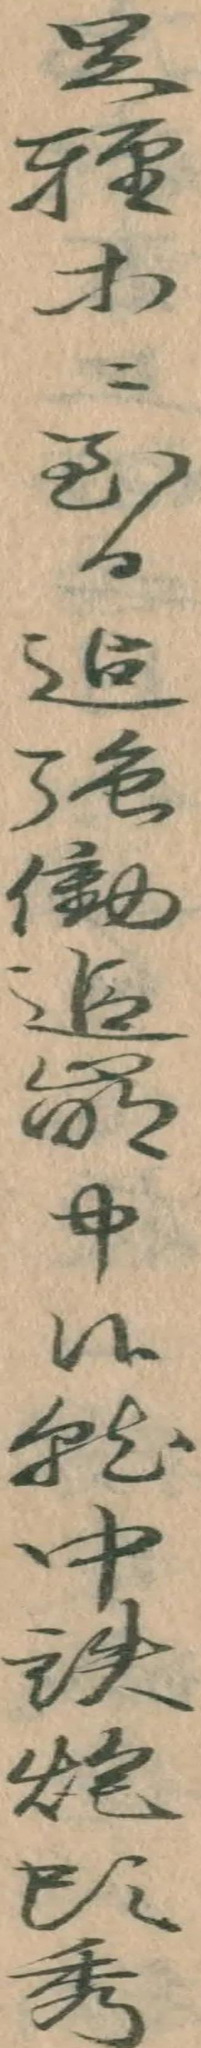足軽等に至る迄強働迄崩申候就中鉄炮頭秀
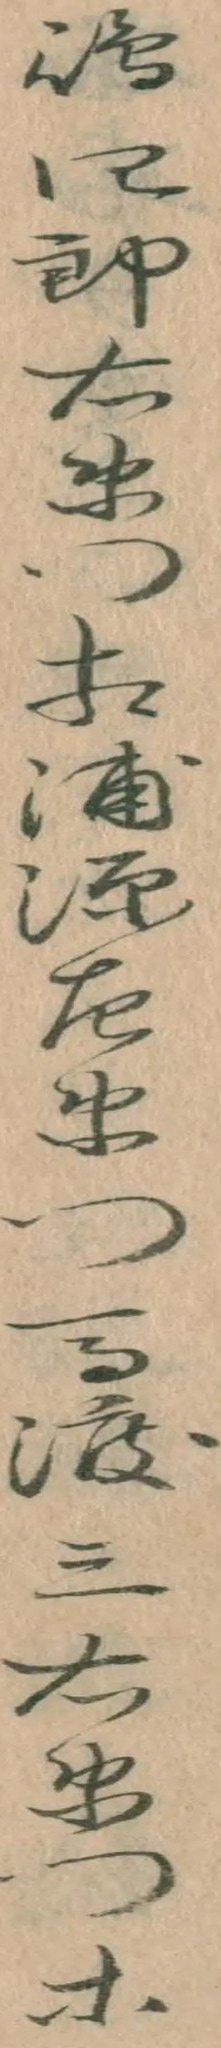島四郎右衛門相捕源左衛門馬渡三右衛門等
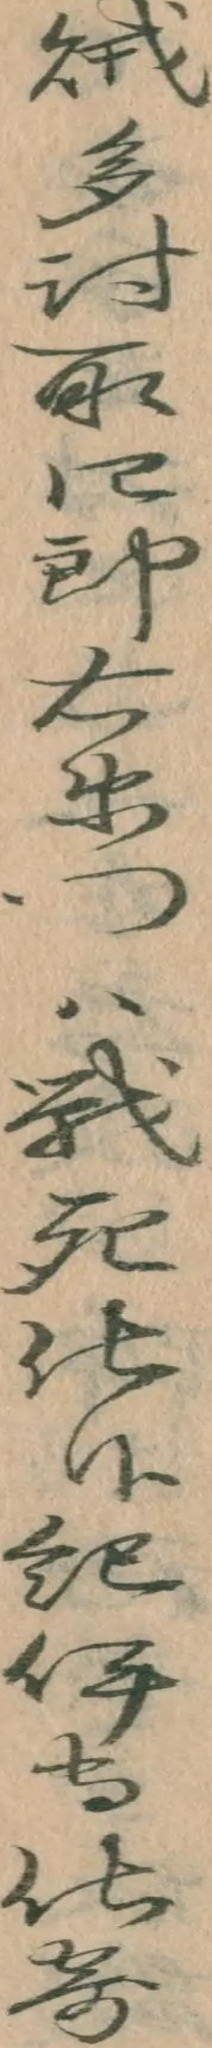賊多討取四郎右衛門は戦死仕候紀伊守仕寄
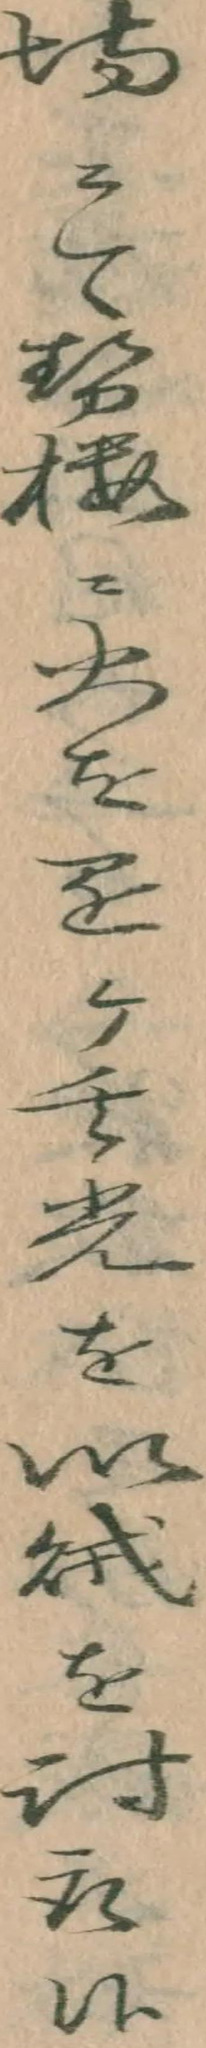場にて勢樓に火を懸け其光を以賊を討取候
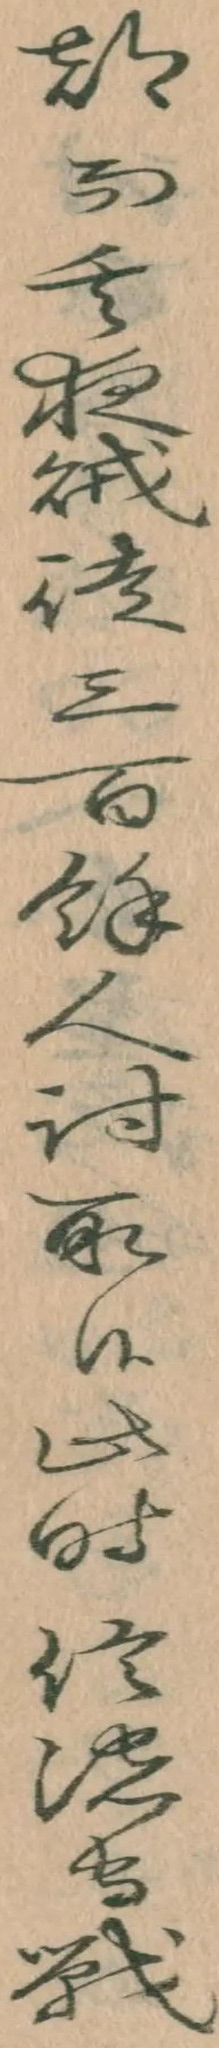都而其夜賊徒三百余人討取候此時信濃守戦
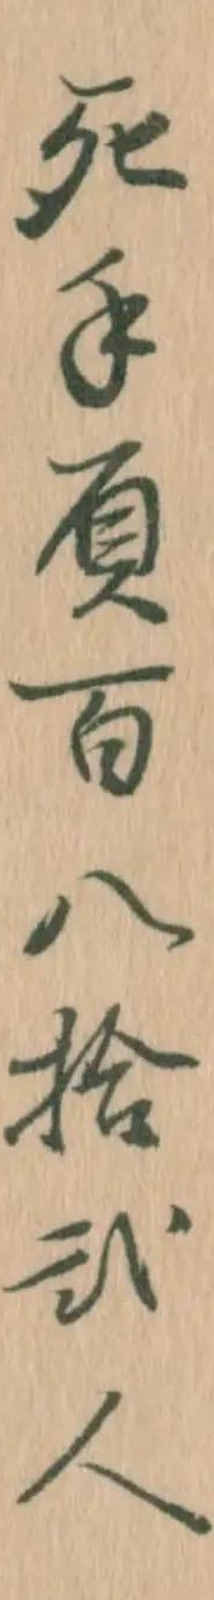死手負百八拾弐人

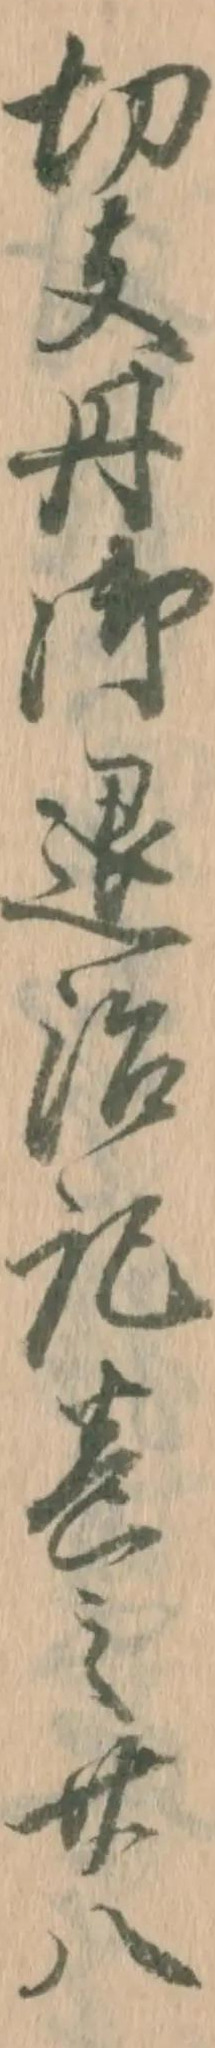切支丹御退治記巻之廿八
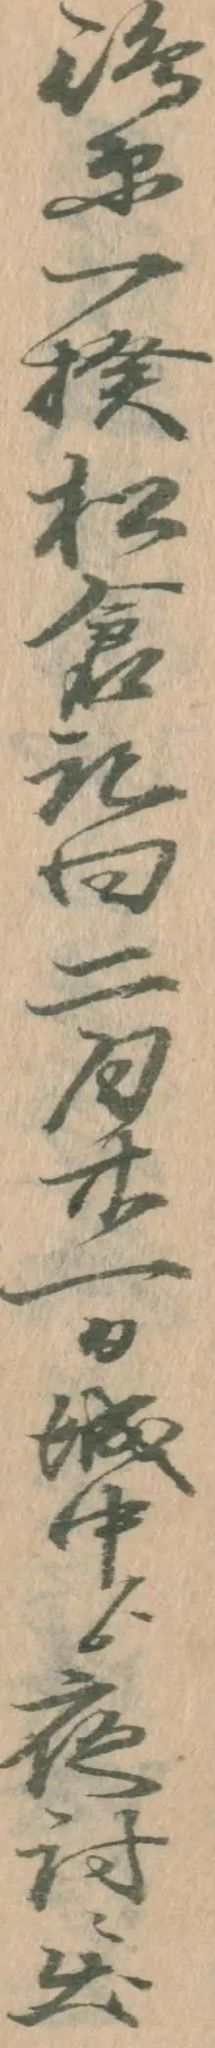島原一揆松倉記曰二月廿一日城中ゟ夜討に出
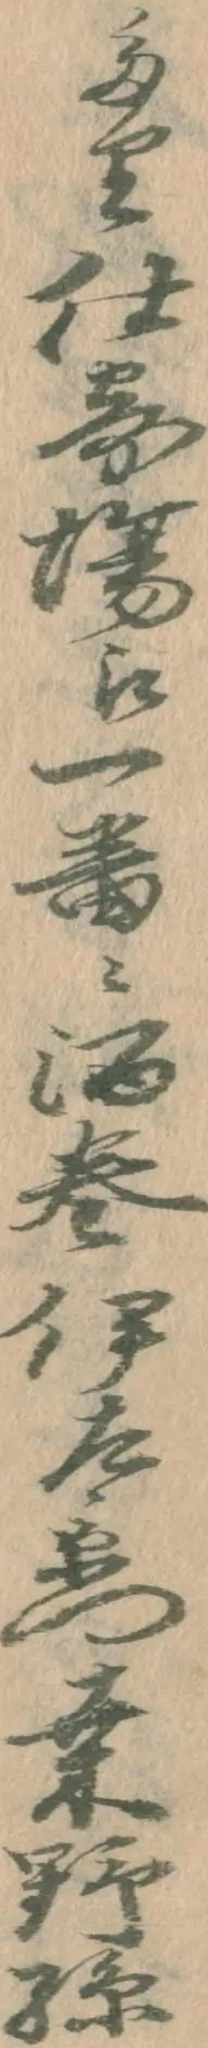多里仕寄場江一番に酒巻伊左衛門桑野孫
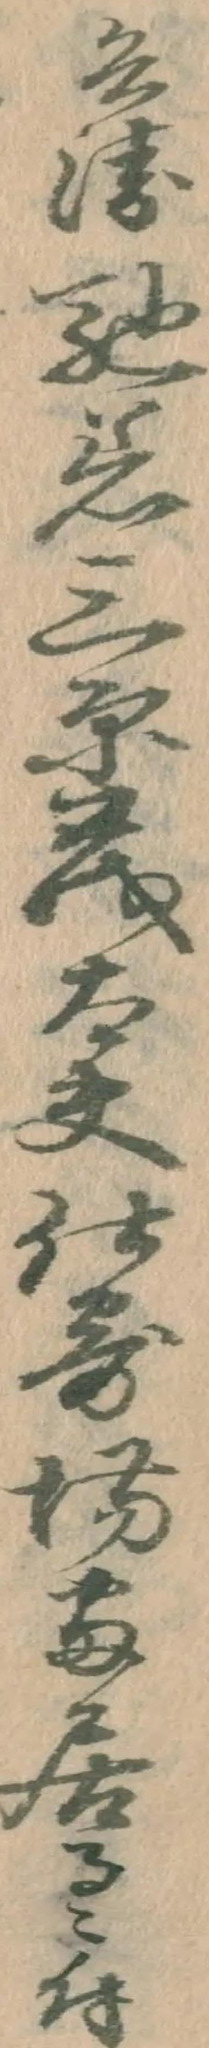兵衛馳着三原茂太夫仕寄場番居るに付
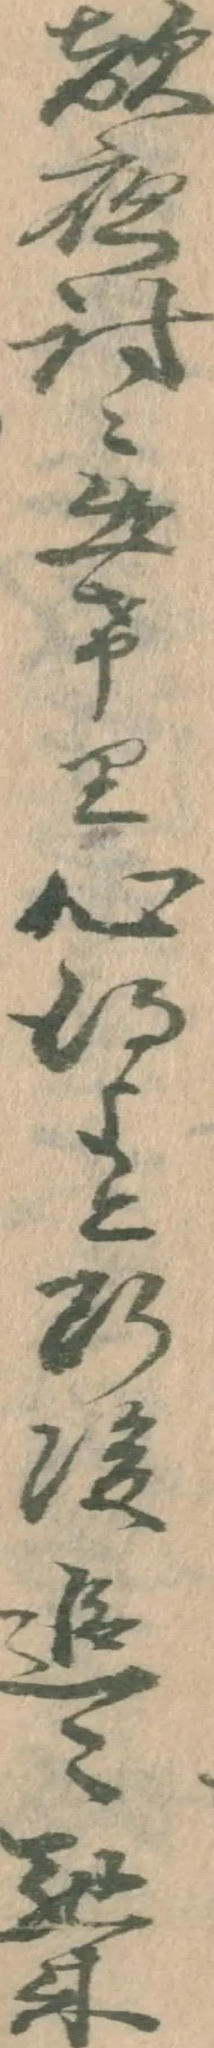敵夜討に出希里心得よと断後追々馳来
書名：切支丹御退治記 49巻. [7]
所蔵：国立国会図書館 National Diet Library, JAPAN
